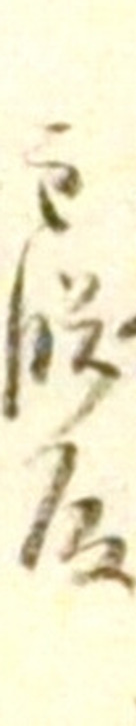主膳殿
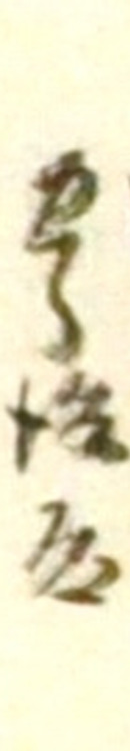豊後殿
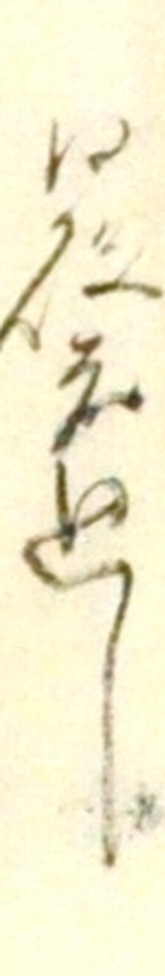同役衆廻し
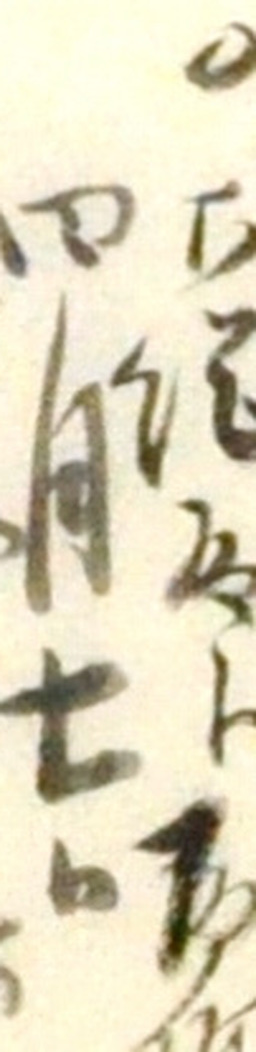四月七日
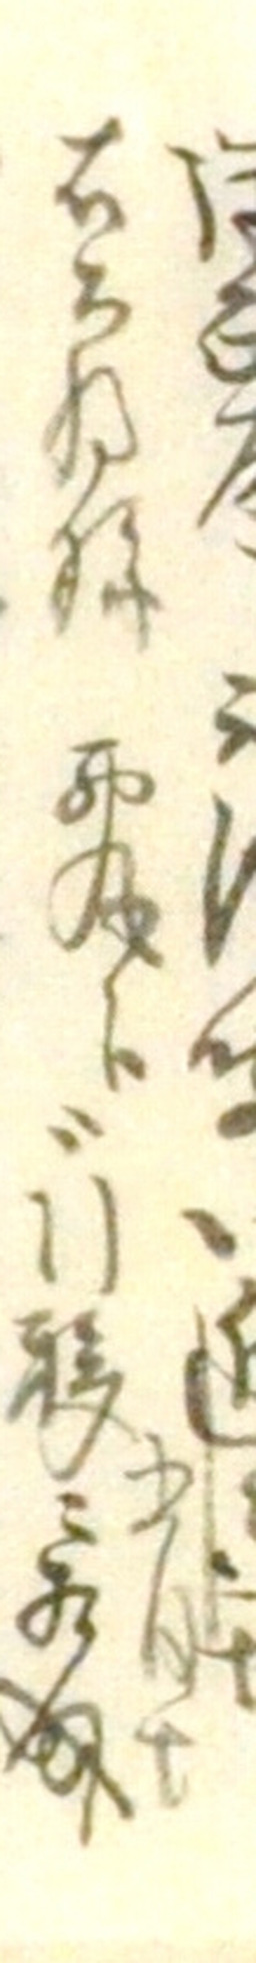右大将様西丸え御引移に相成候
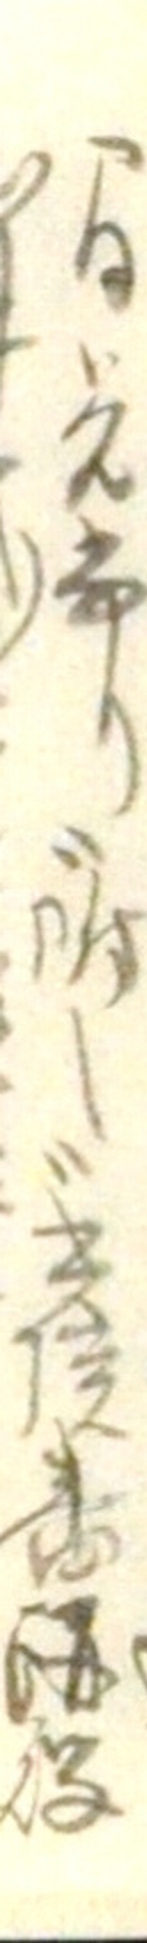間差当り御附之御書院番跡役
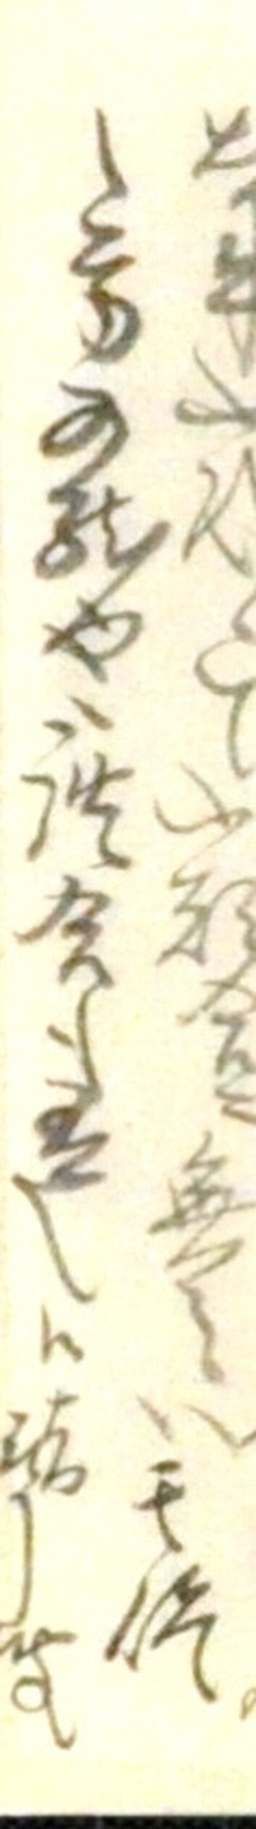之方可然や御詰合も有之候旨被申聞候

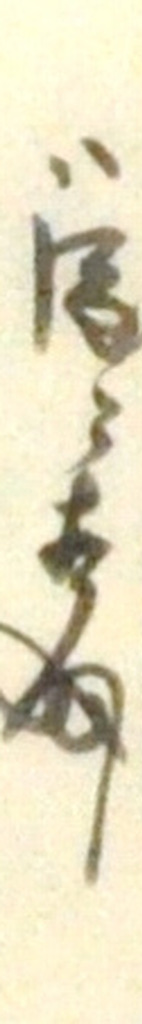は後に相成候
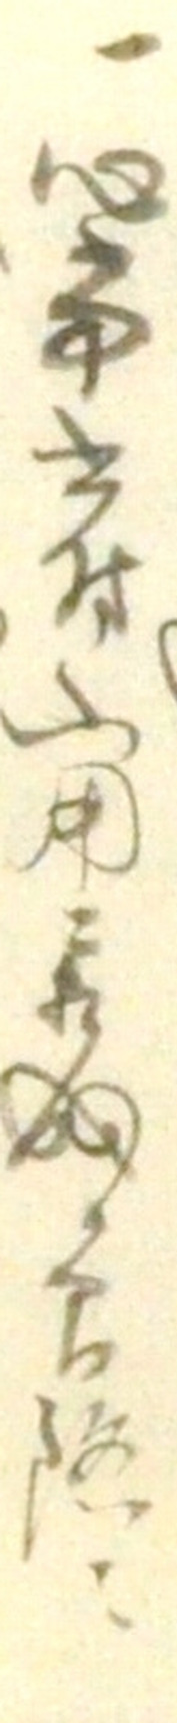一心当書付不用に相成候間銘々
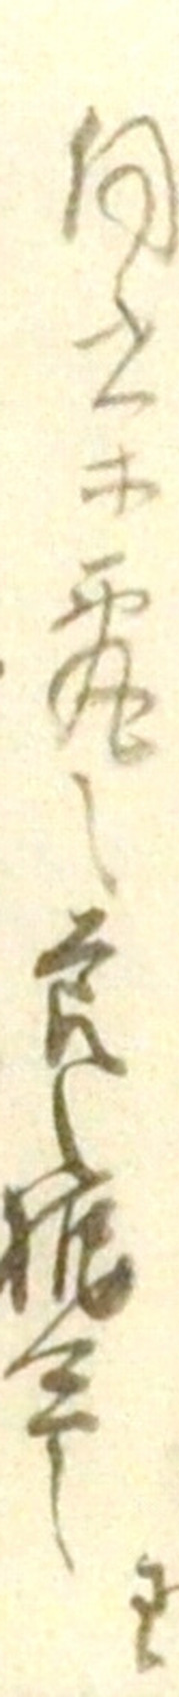伺書等西丸之節之振合之
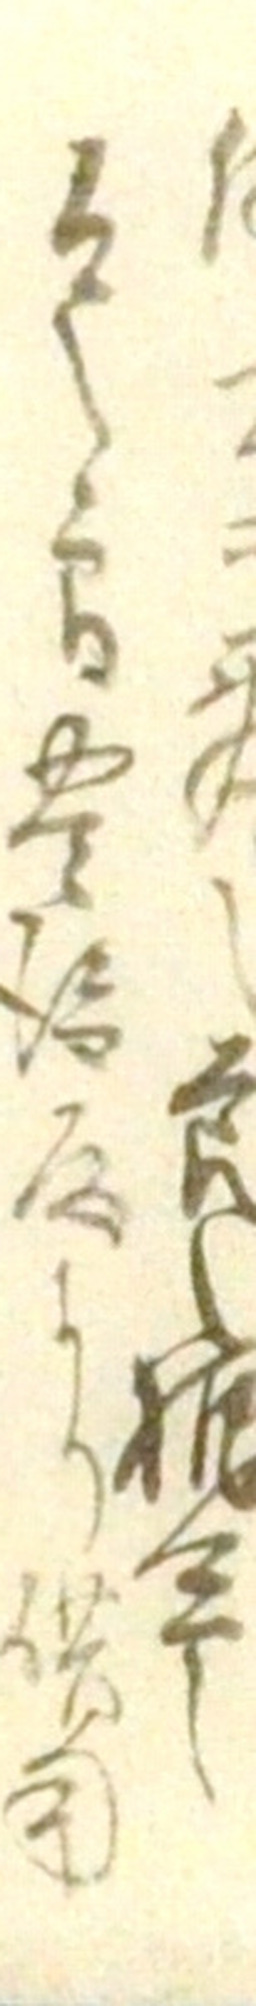有之候間豊後殿より借用
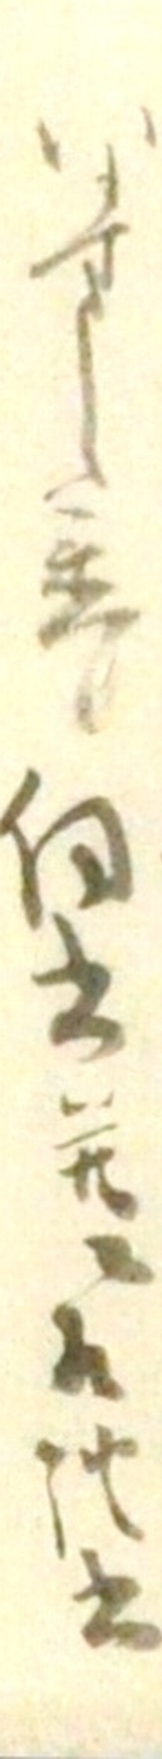いたし置候伺書并に相談書
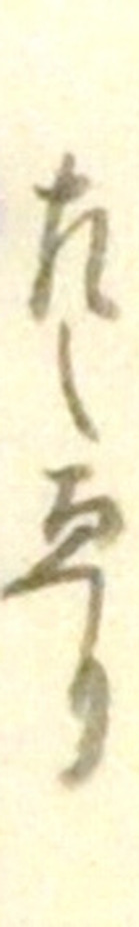左之通り
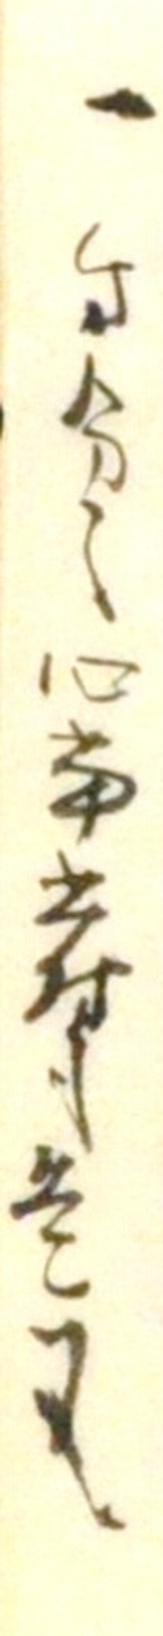一自分之心当書付も是又

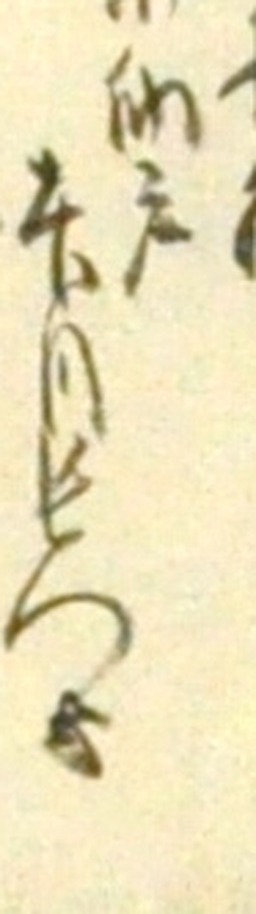本田長門守
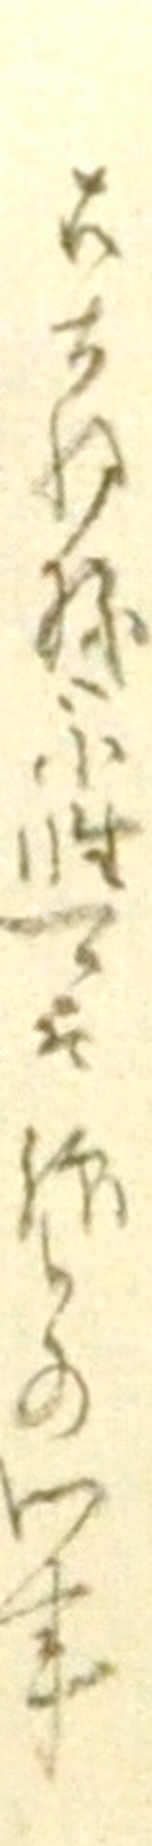右大将様御小姓可被仰との御事
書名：万覚
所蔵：伊那市立高遠町図書館・合同会社AMANE
